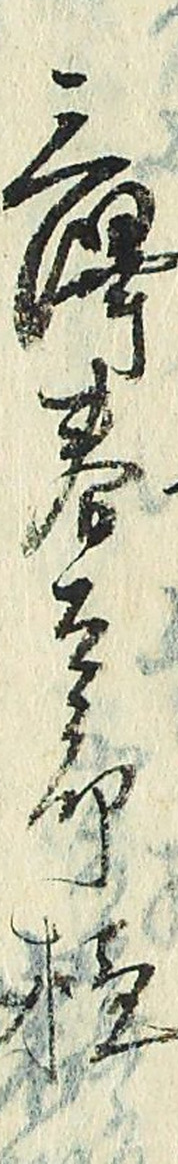三澤春太郎様
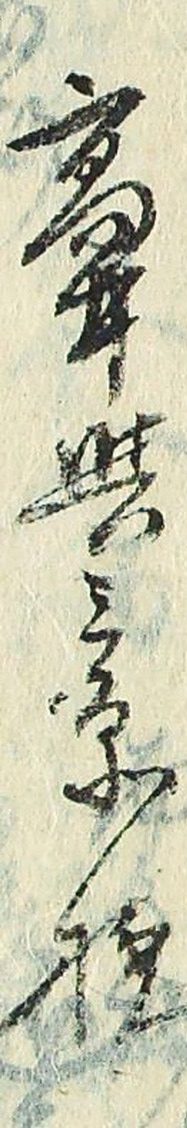高井與三兵衛様

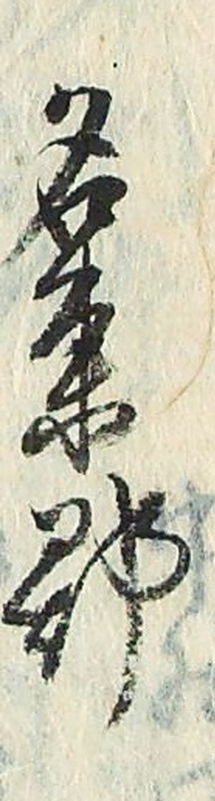名東郡
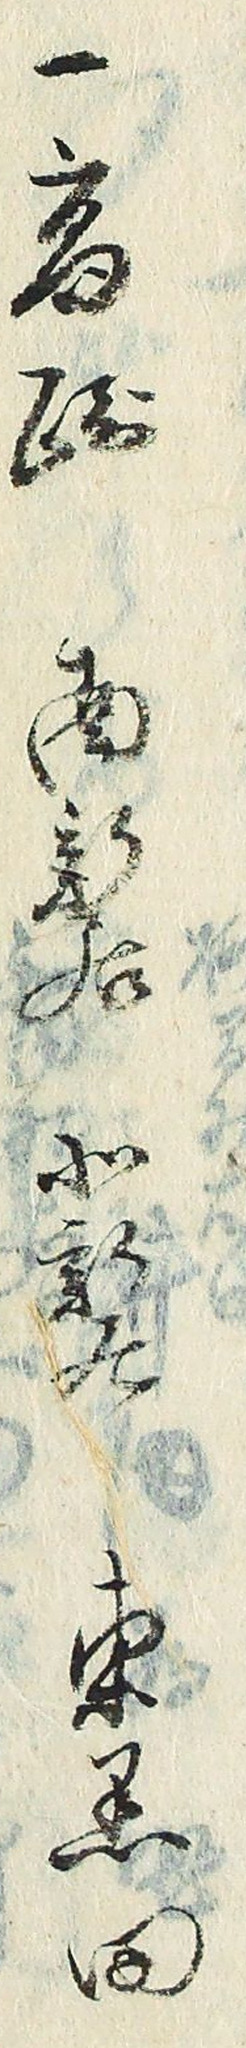一高崎南新居北新居東黒田
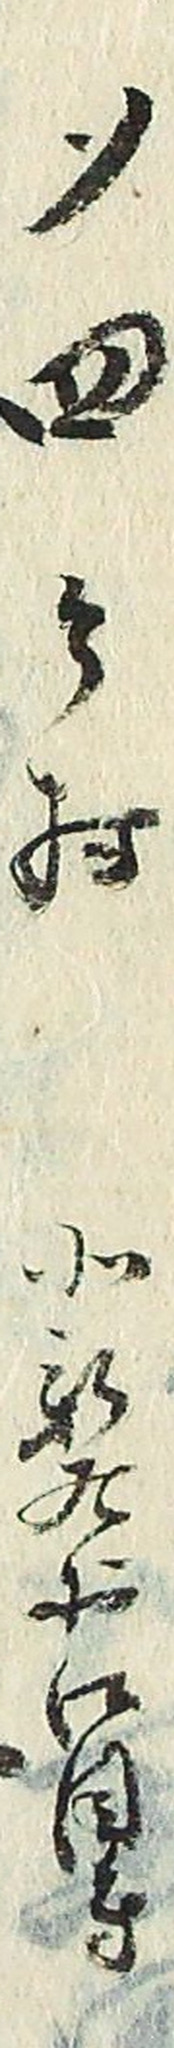〆四ケ村北新居村郷目付
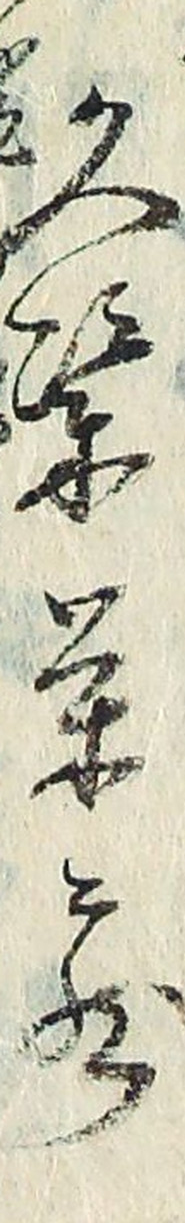久粢栄蔵
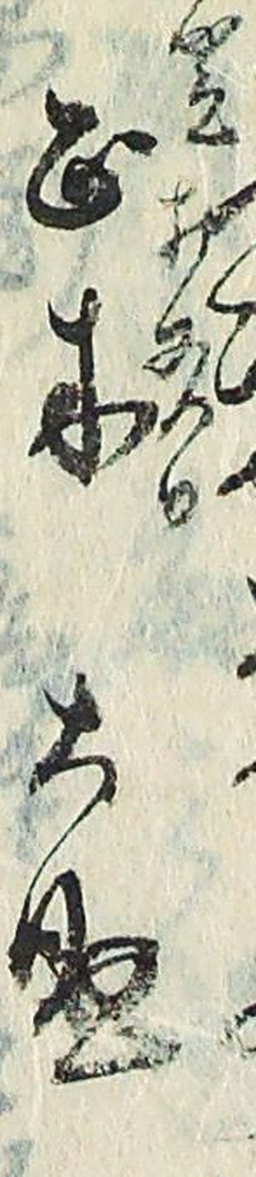正木大助
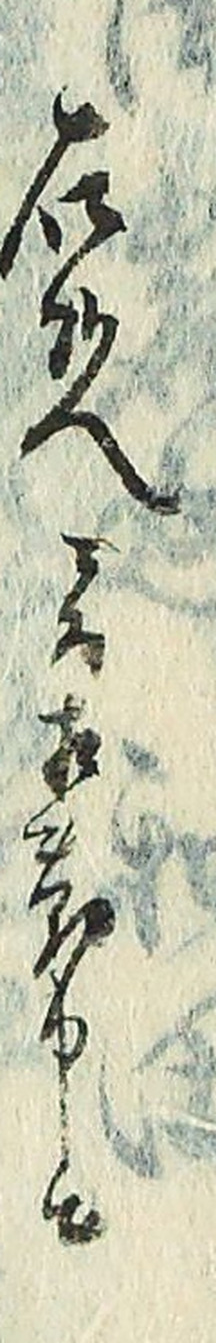右弐人ニ而相勤申候
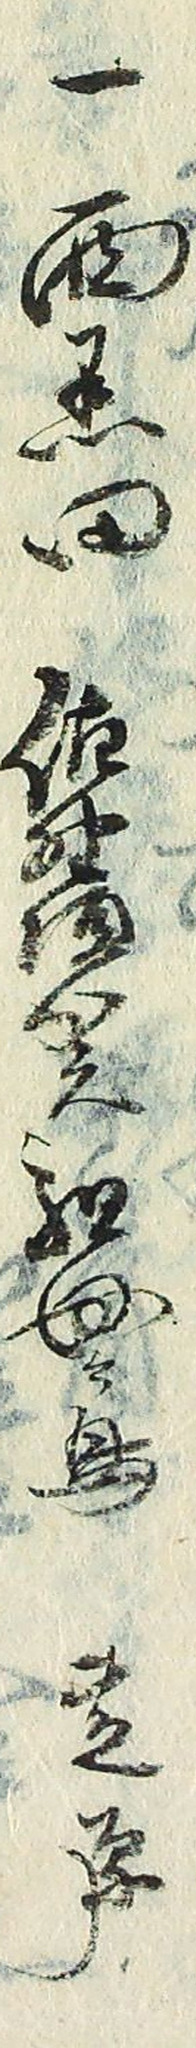一西黒田佐野須賀祖母ケ島芝原
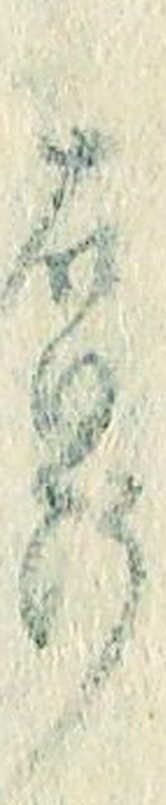右同断
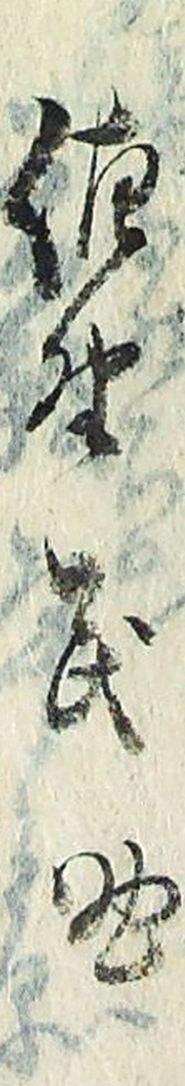佐野民助
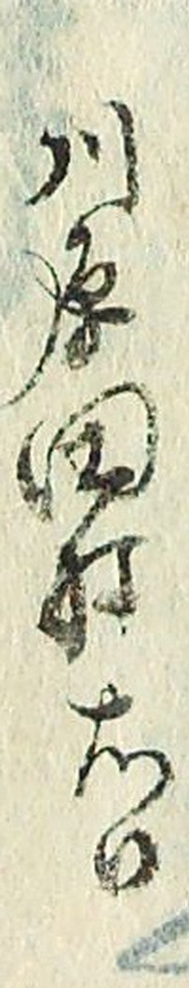川原田村右同
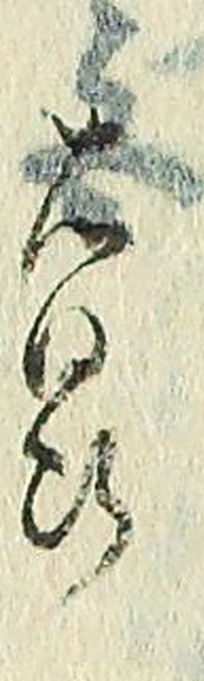右同断
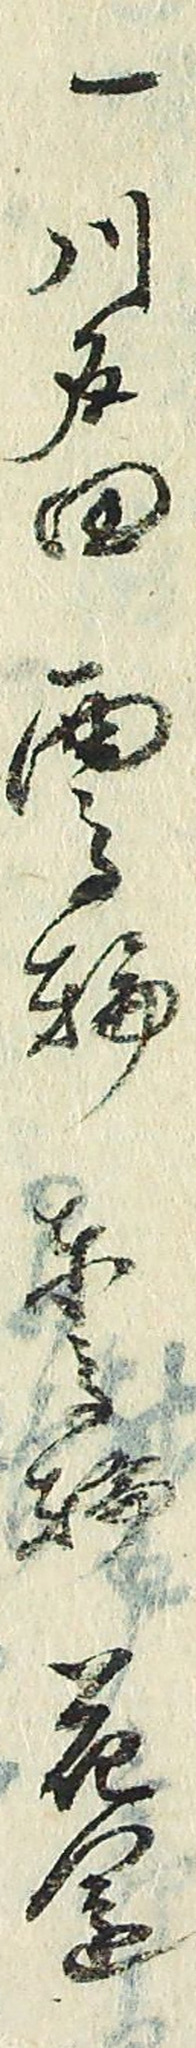一川原田西高輪東高輪花園
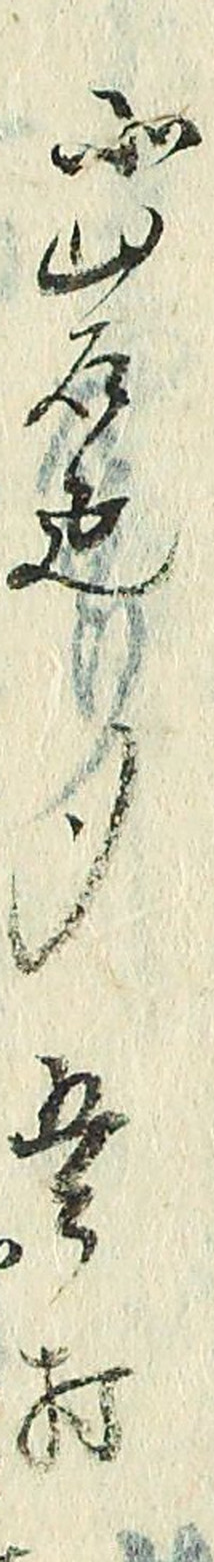北岩延〆五ケ村
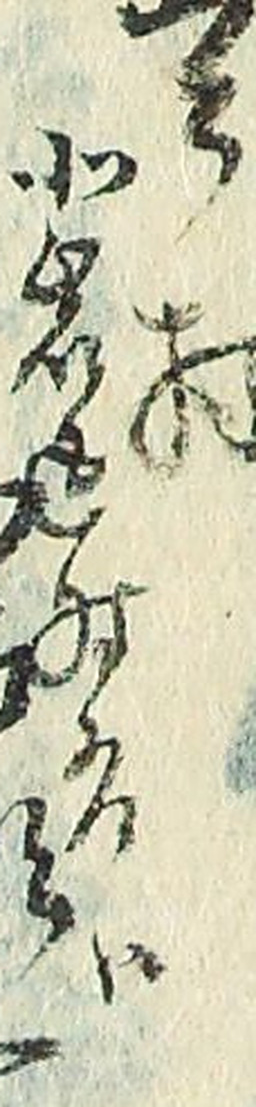北岩延村右同
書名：諸御趣意書并御下知向之写
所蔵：鳴門教育大学 Naruto University of Education
